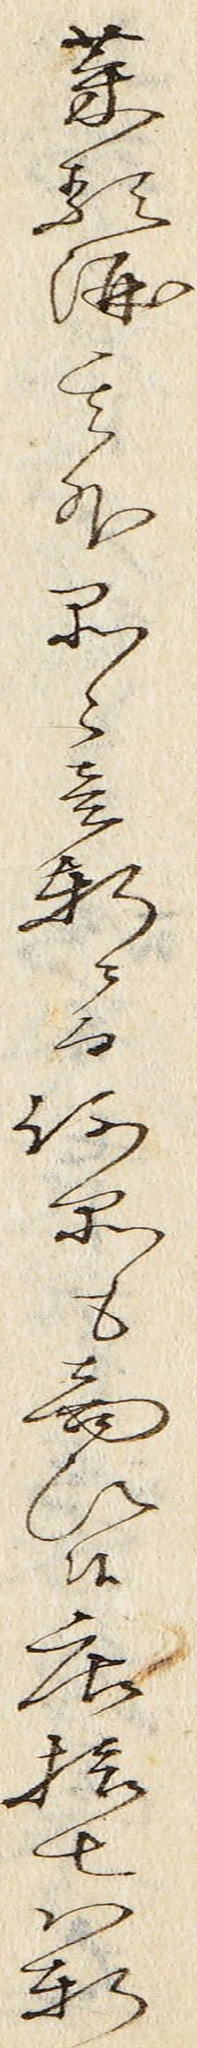菜類併其外品々壱軒に而何品も商ひ候店拾七八軒
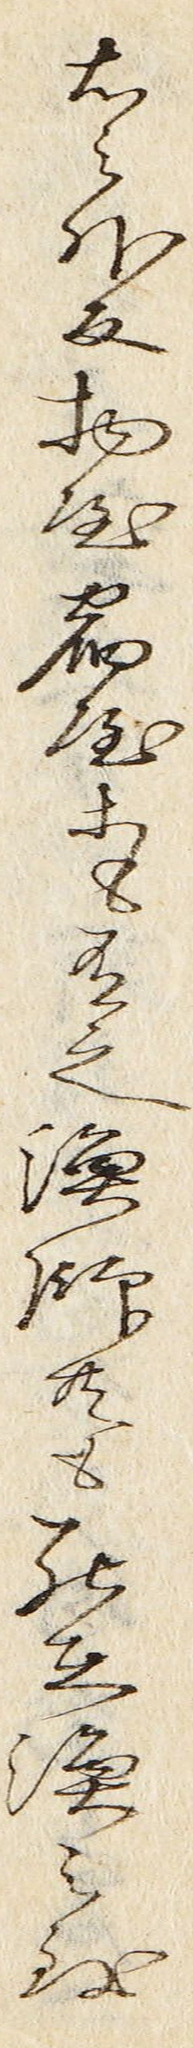右之外反物屋宿屋等も有之漁師共も罷在漁之致
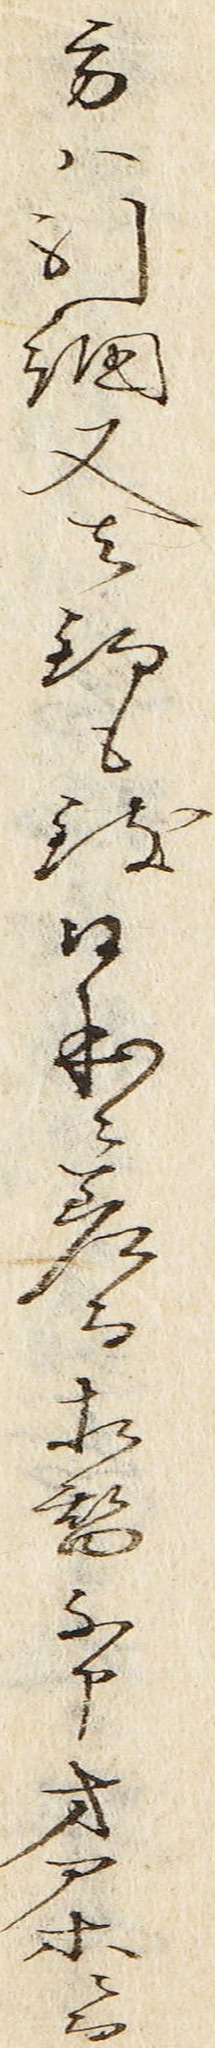方は引網又は釣も致日本に差而相替被不申オアホに而
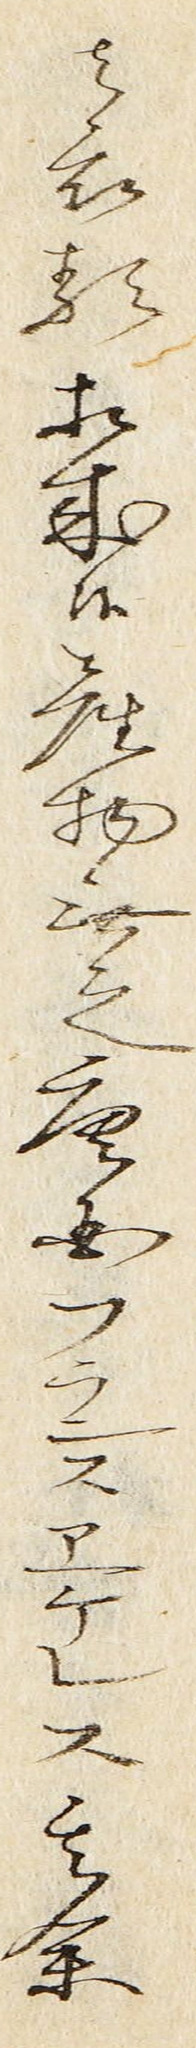は衣類相成候産物無之唐国フランスエケレス其余
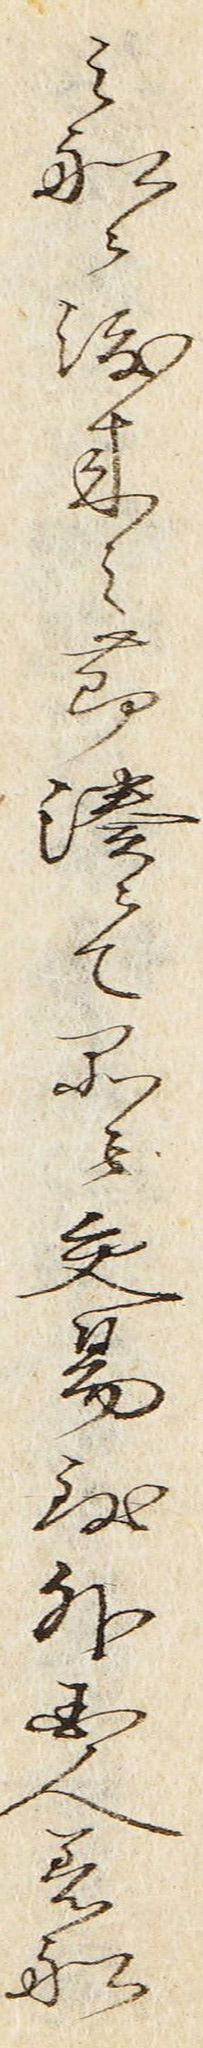之船に渡来之節湊にて品々交易致外国人着船
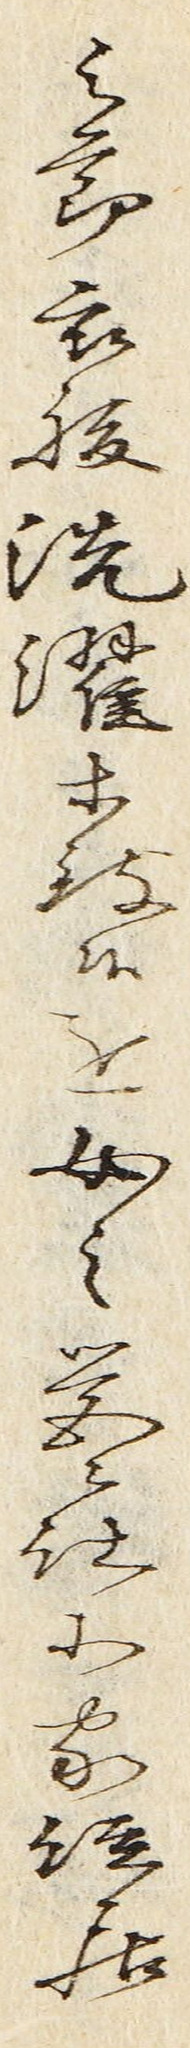之節衣服洗濯抔致候を女之営に仕小家住居
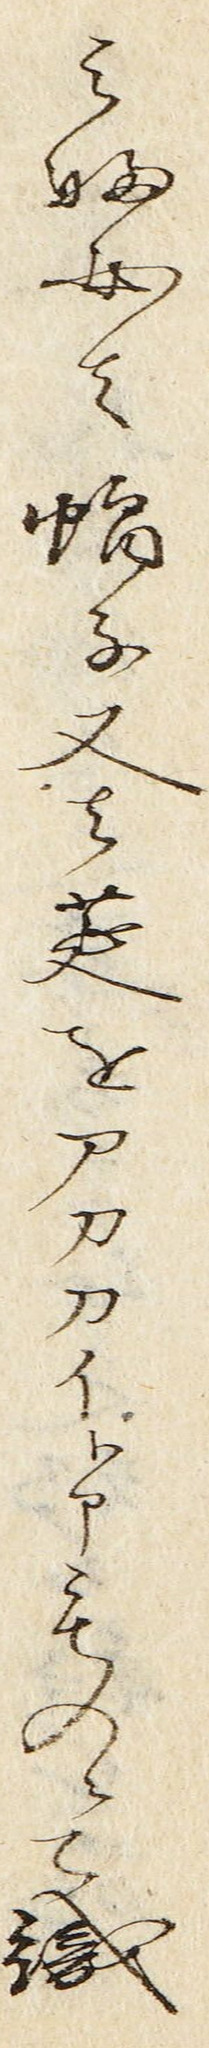之婦女は帽子又は莚をアカカイト申ものにて織
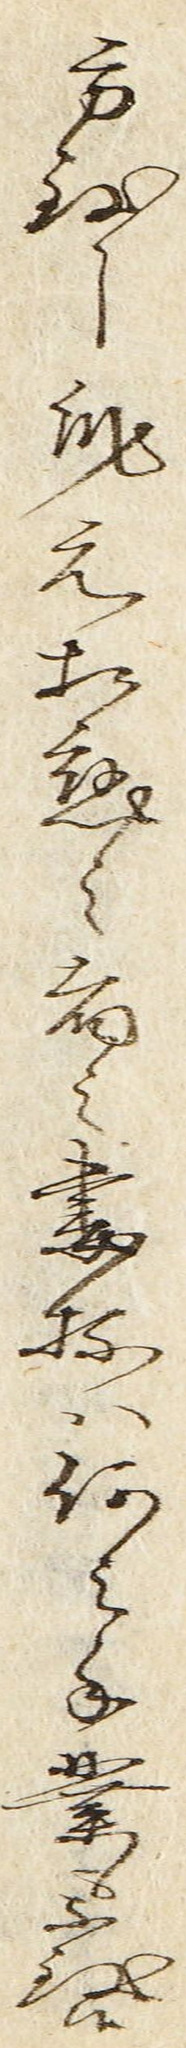方致し身元相応之者之妻抔は何之手業も不致候
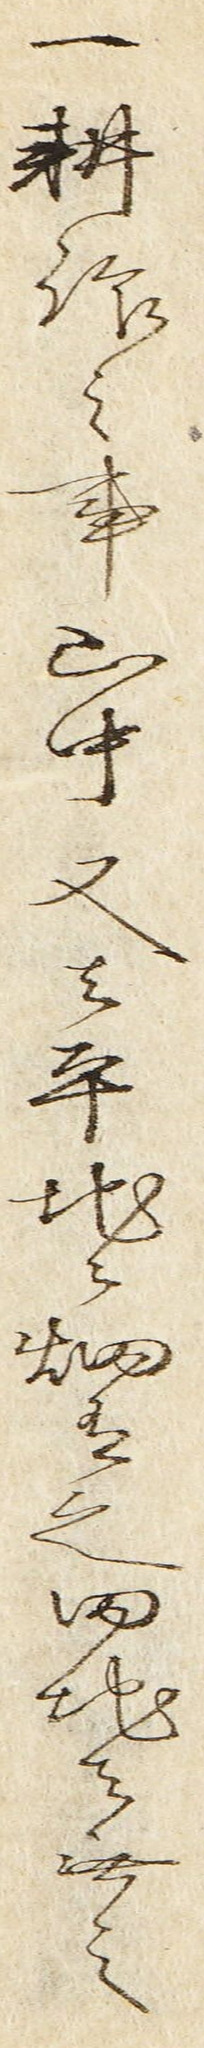一耕作之事山中又は平地に畑有之田地は無之

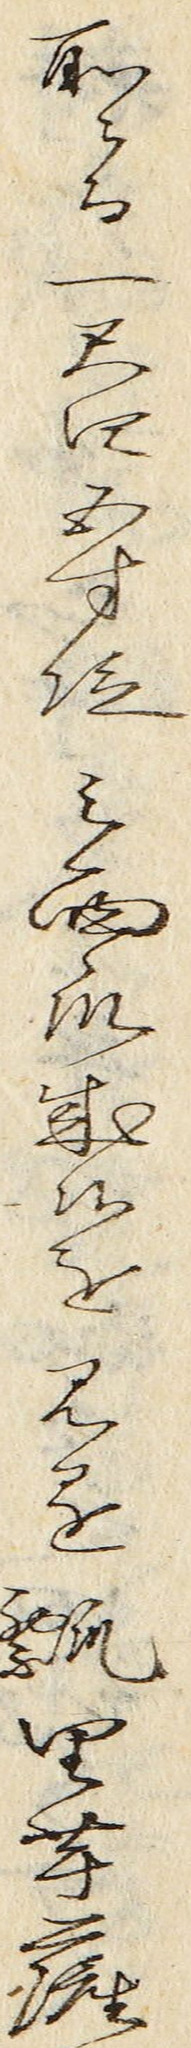所に而一尺四五寸位之西瓜成候を見懸瓢里芋薩
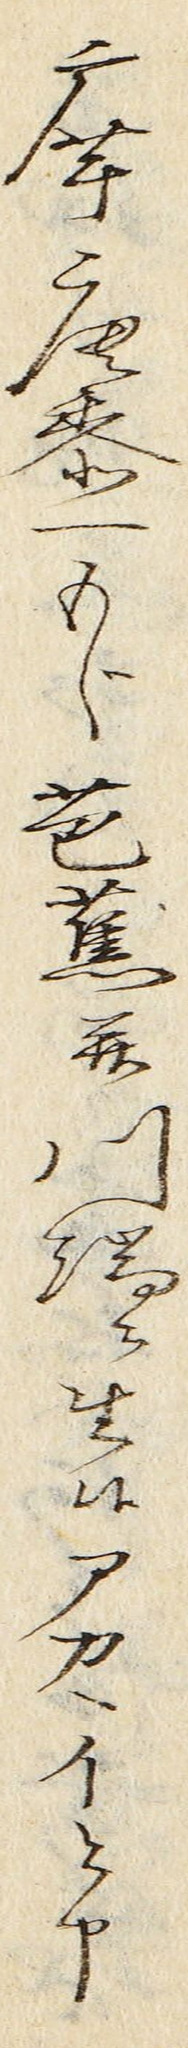摩芋唐黍一もじ芭蕉并川端に生候アカヽイと申
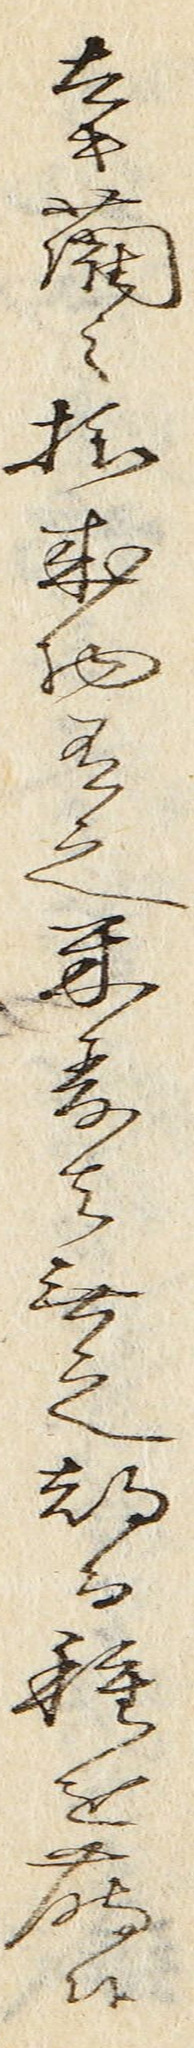太き藺之様成物有之米麦は無之都而種を蒔候
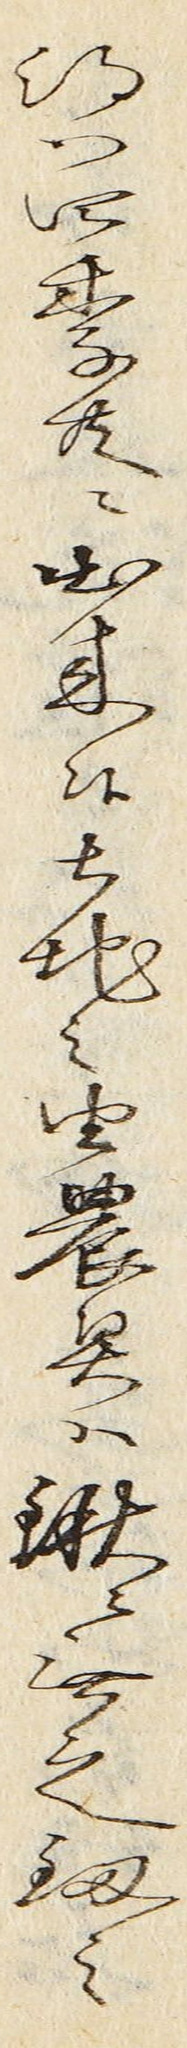得は四季共に出来候土地之由農具は鍬に無之釼之
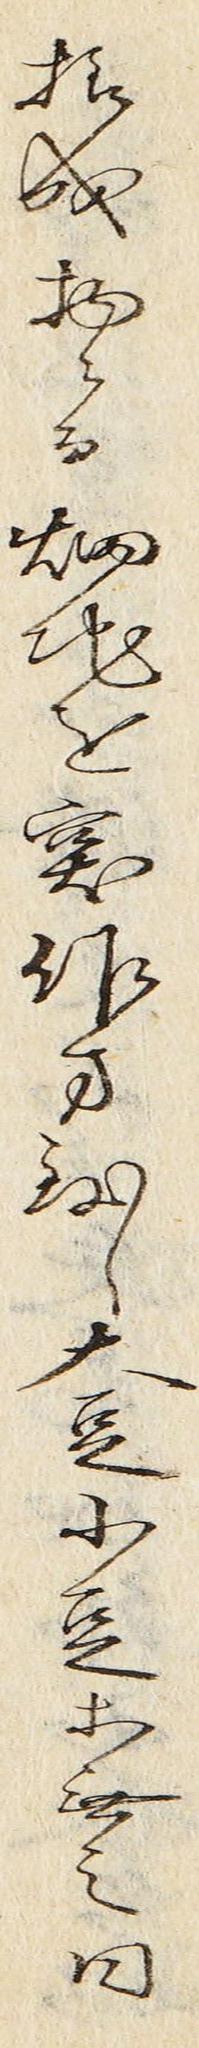様成物に而畑地を突作方致し大豆小豆等無之日
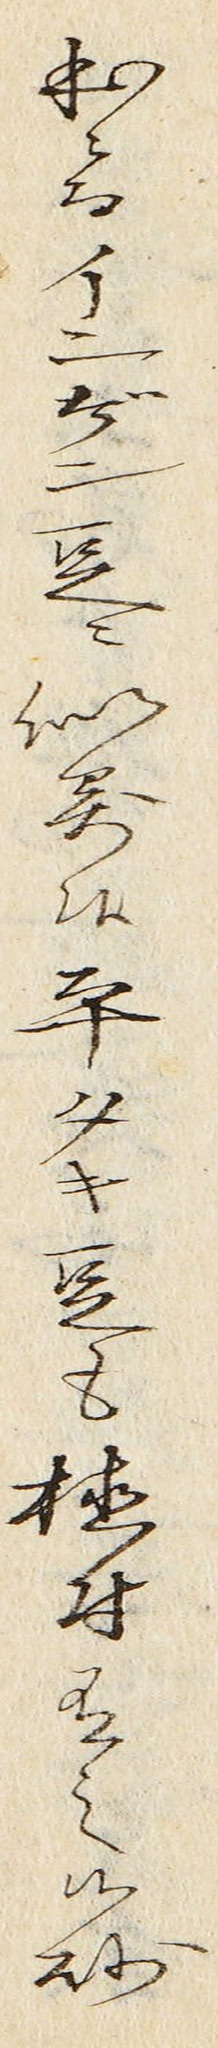本に而インゲン豆に似寄候平タキ豆も植付有砂
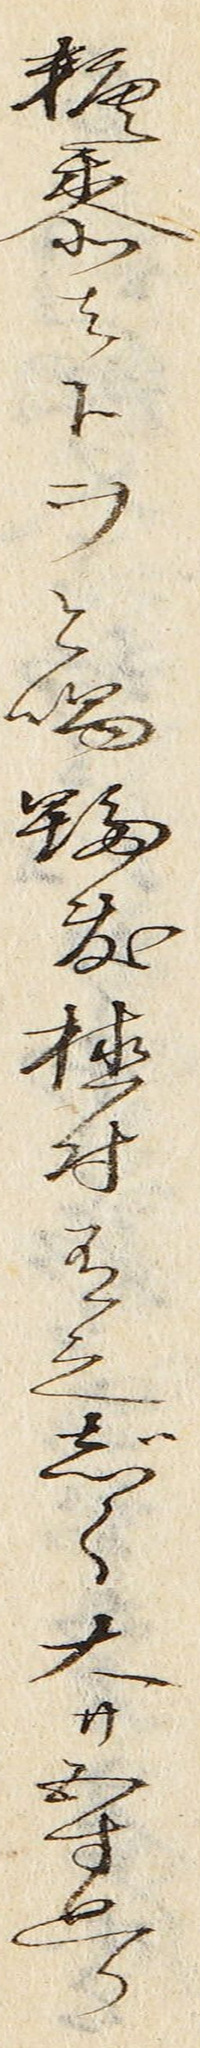糖黍はトヲと唱夥敷植付有之じく大サ五寸廻り
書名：土佐中浜万次郎漂流記
